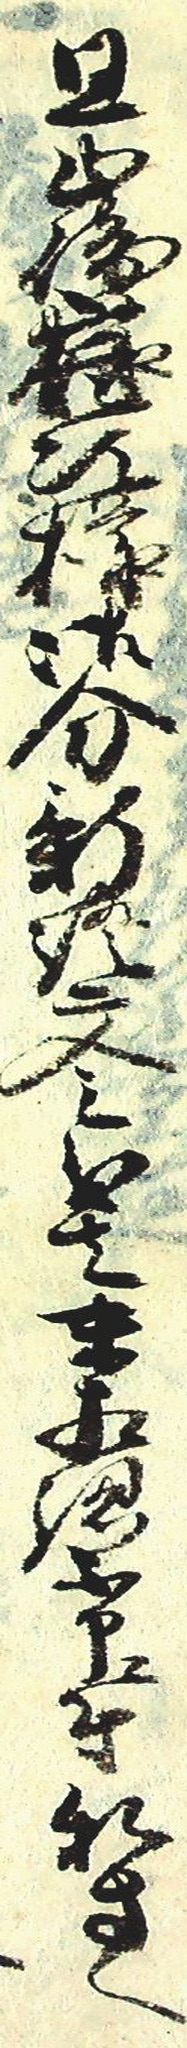且山崎官次様御分新証文之義は未相認不申に付私方へ
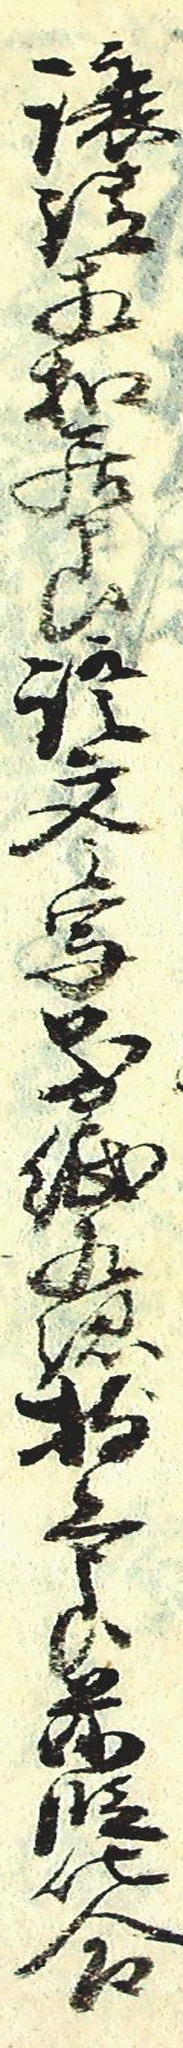譲請相扣居申候証文之写別紙相認指上申候前段仕合
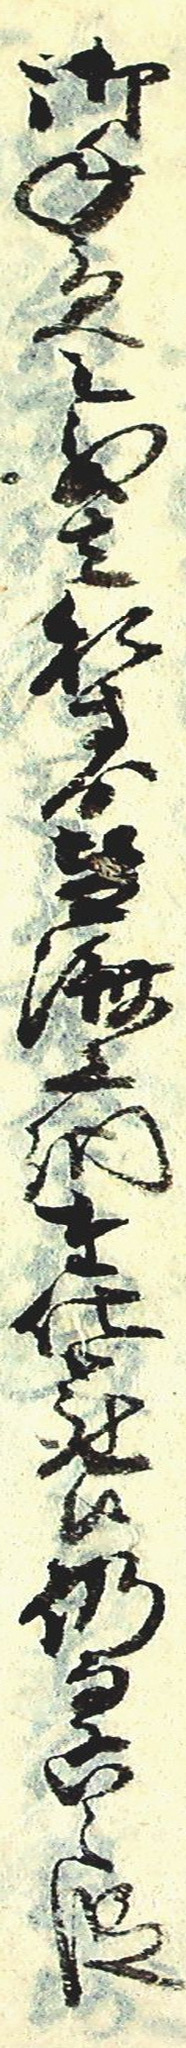御年貢之義は私方ゟ皆済上納奉仕御座候仍て右之段
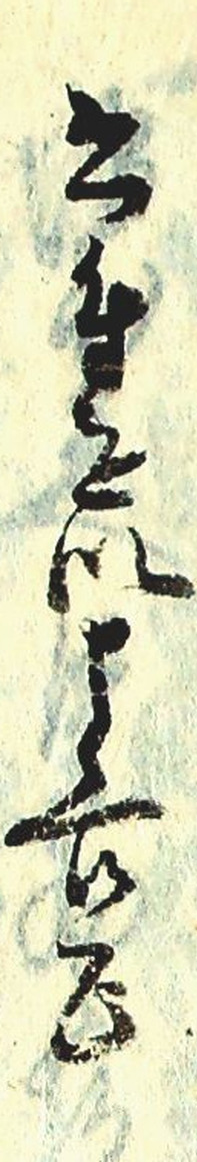書付を以申上候以上
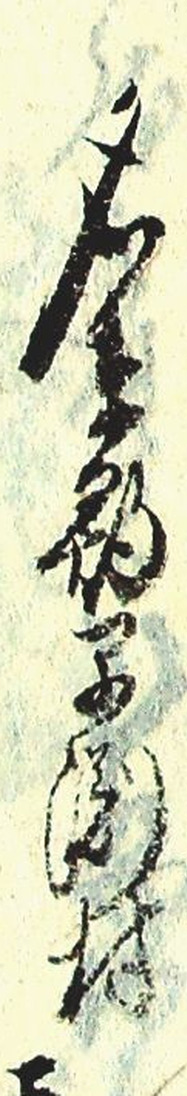名東郡早淵村
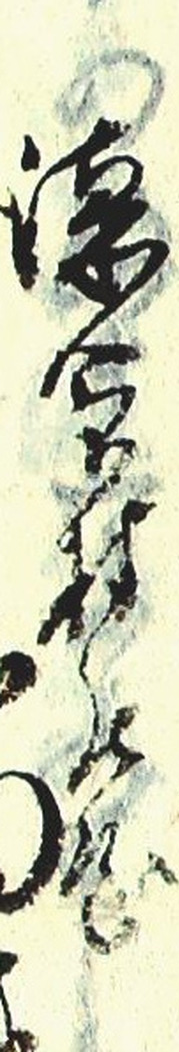徳命村庄屋
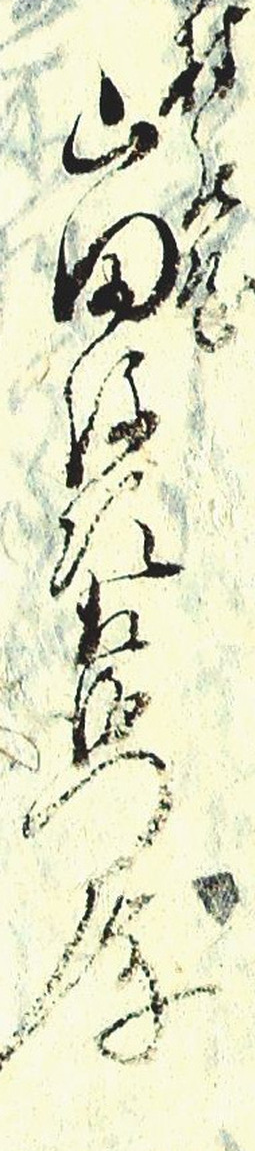山田弥次左衛門殿

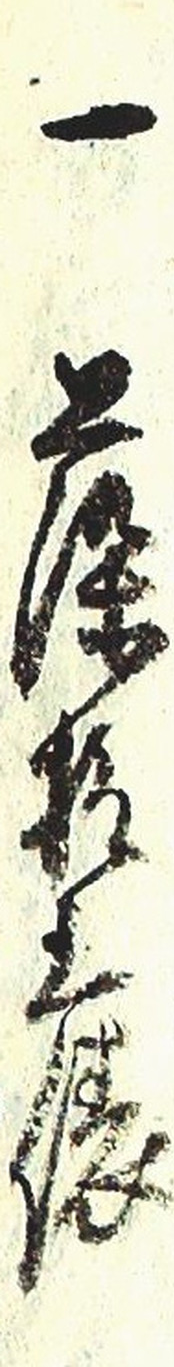一蒅拾三俵
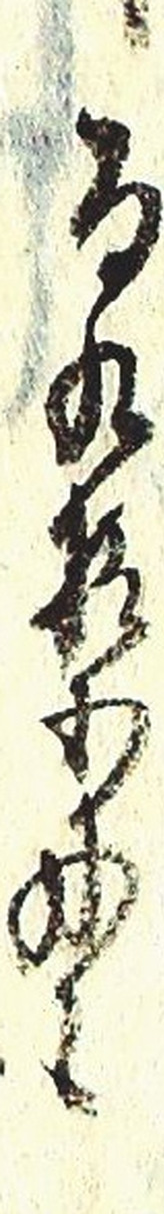正百九拾五貫
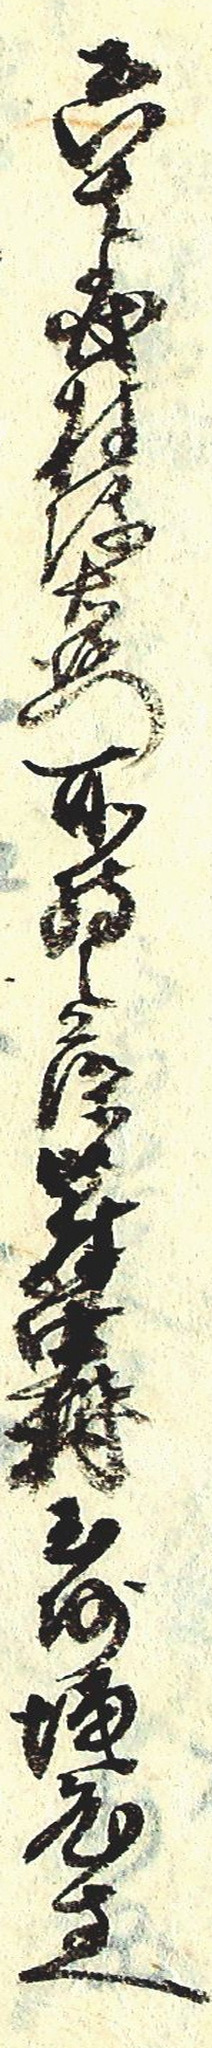右は当村弥右衛門所持之蒅府中村玉師増屋方へ
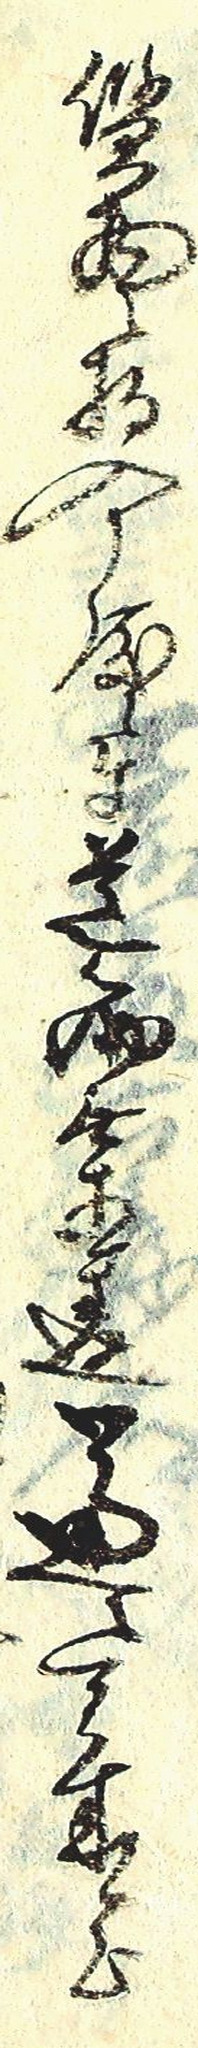質物に指入申度に付道筋無相違御通し可被成候以上
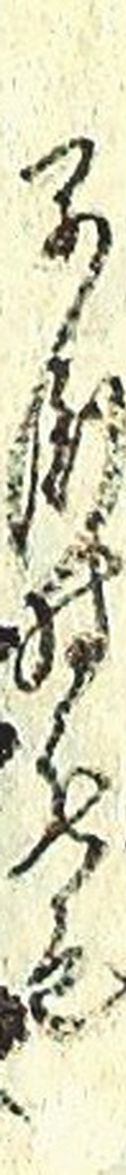早淵村庄屋
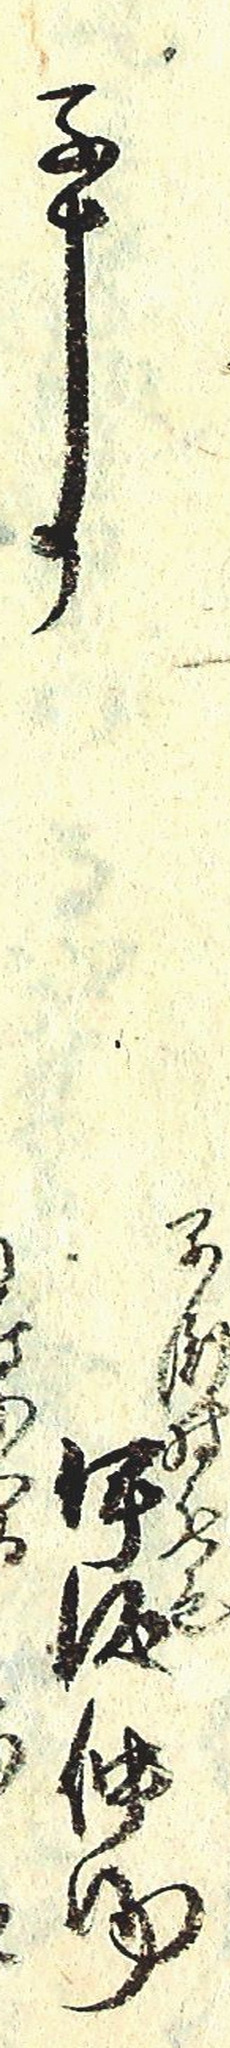子十月伊沢仲助
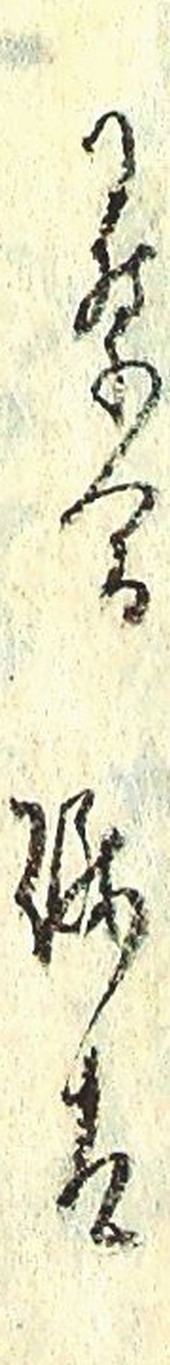同村五人与
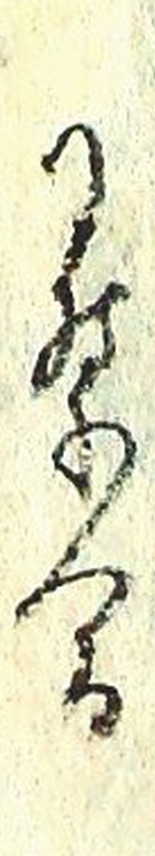同村五人与
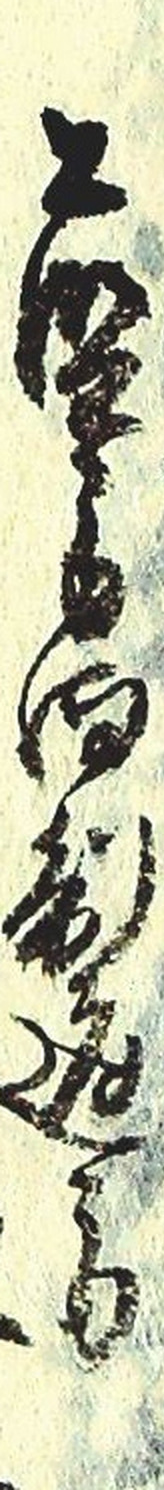藍方御制道方
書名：諸御願書控(弐番）
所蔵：鳴門教育大学 Naruto University of Education
